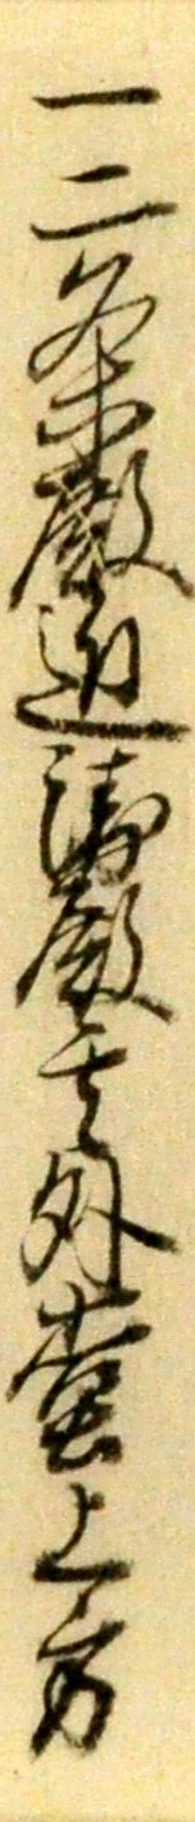一二条殿近衛殿其外堂上方
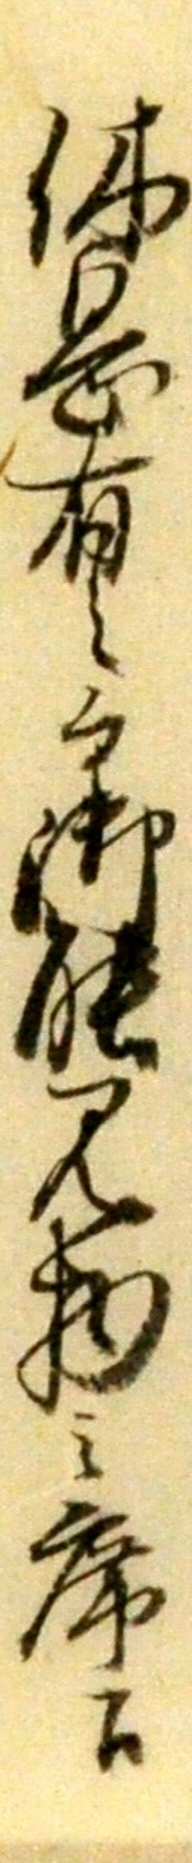休息有之而御能見物之席え
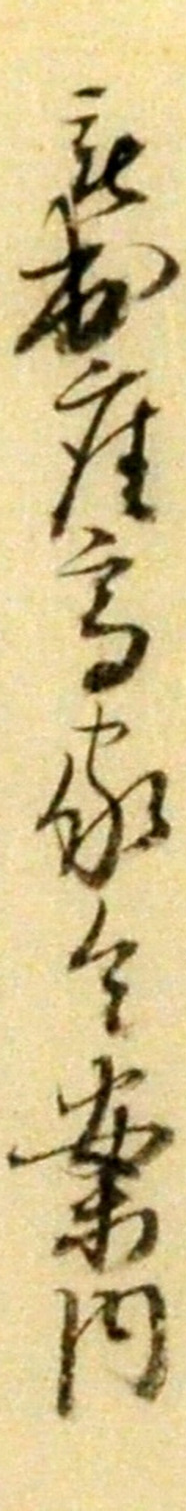被出座高家令案内
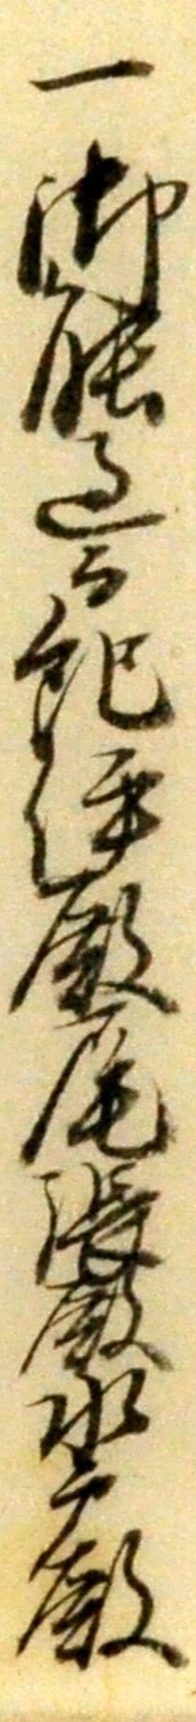一御能過而紀伊殿尾張殿水戸殿
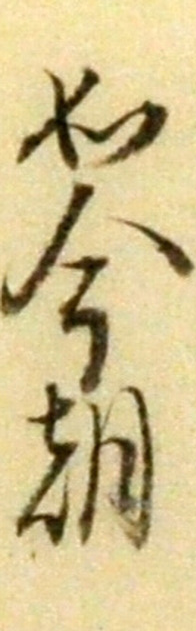如今朝

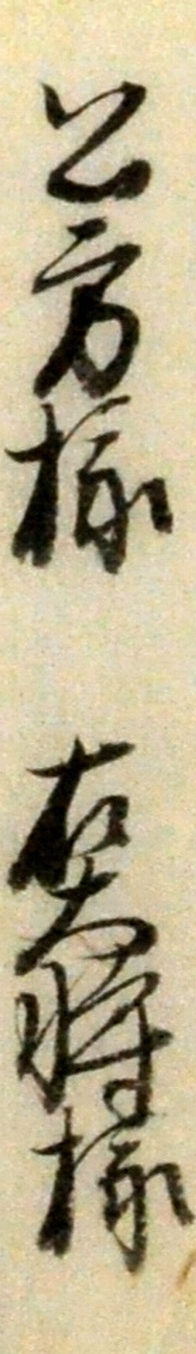公方様右大将様
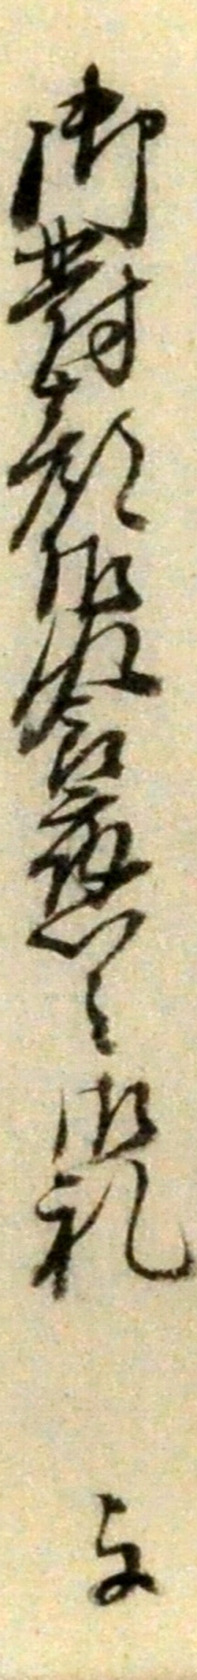御対顔御饗応之御礼与
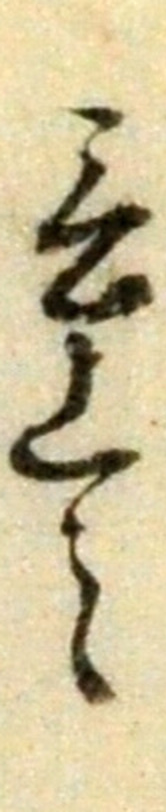言上之
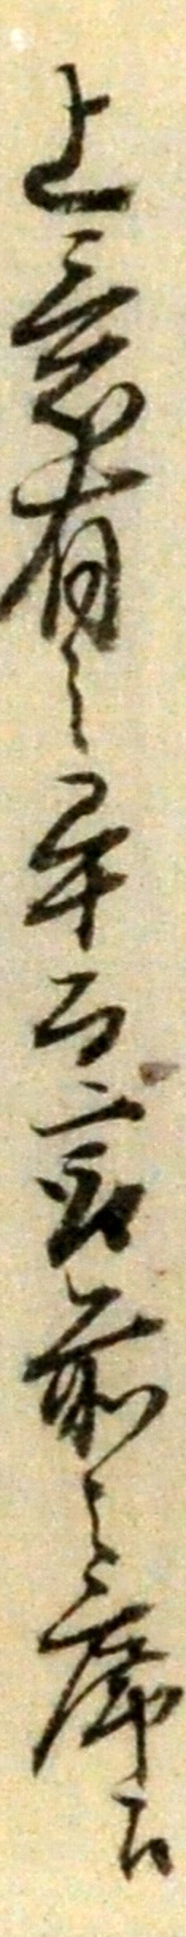上意有之畢而最前之席え
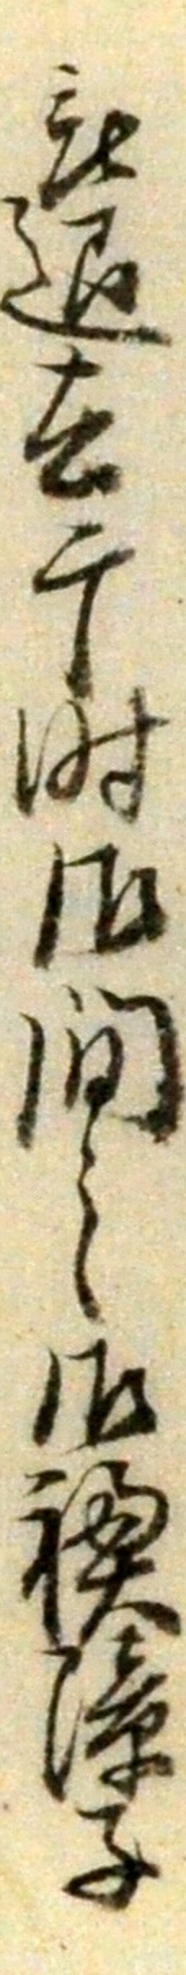被退去于時御間之御襖障子
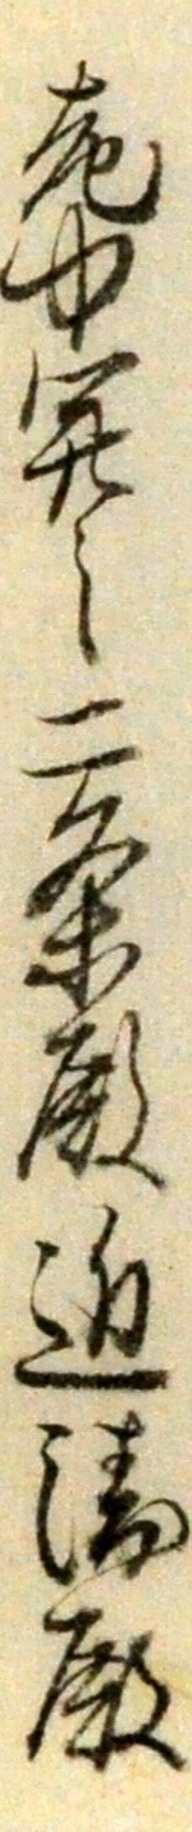老中開之二条殿近衛殿
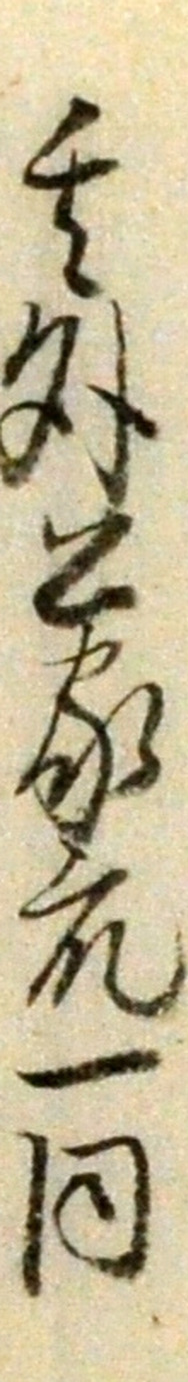其外公家衆一同
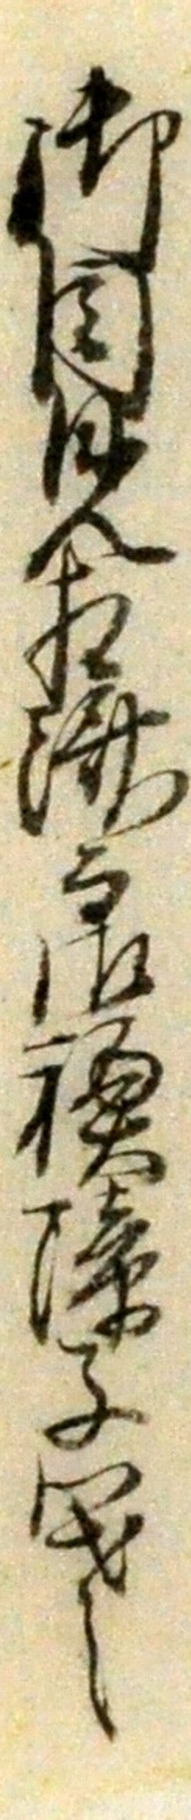御目見相済而御襖障子閉之
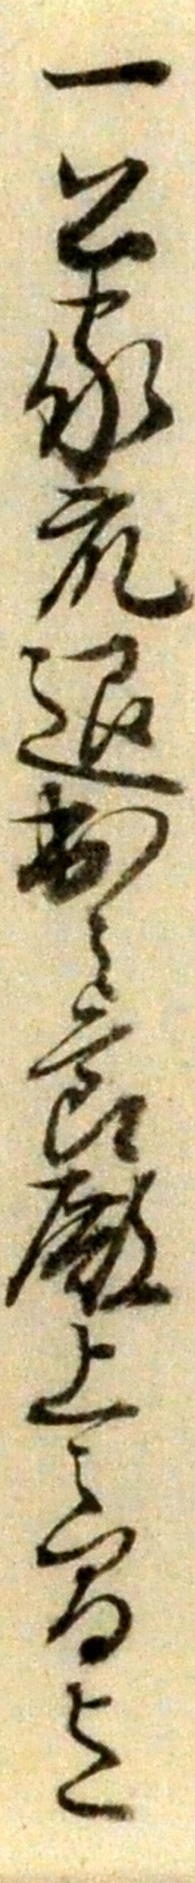一公家衆退出之節殿上之間迄
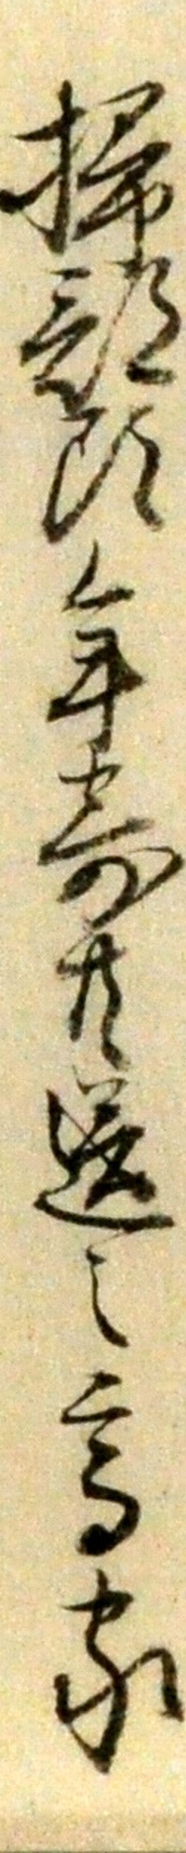掃部頭年寄共送之高家
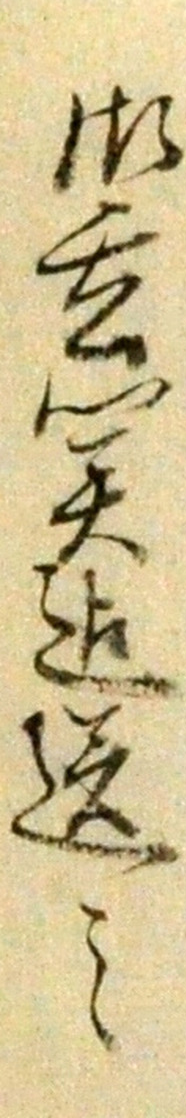御玄関迄送之
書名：御馳走御能ノ節ノ留外
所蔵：伊那市立高遠町図書館・合同会社AMANE
